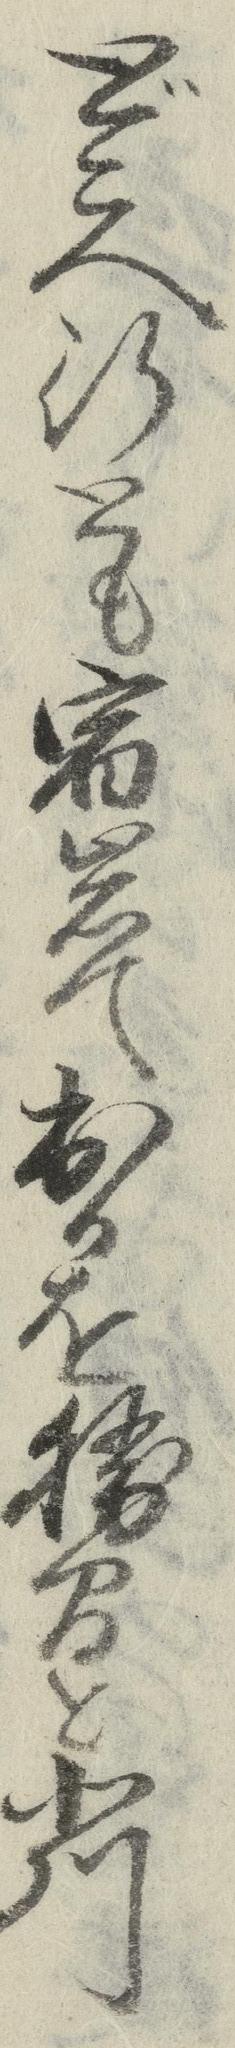どこへ行とも宿岩て出るを勝間と北川
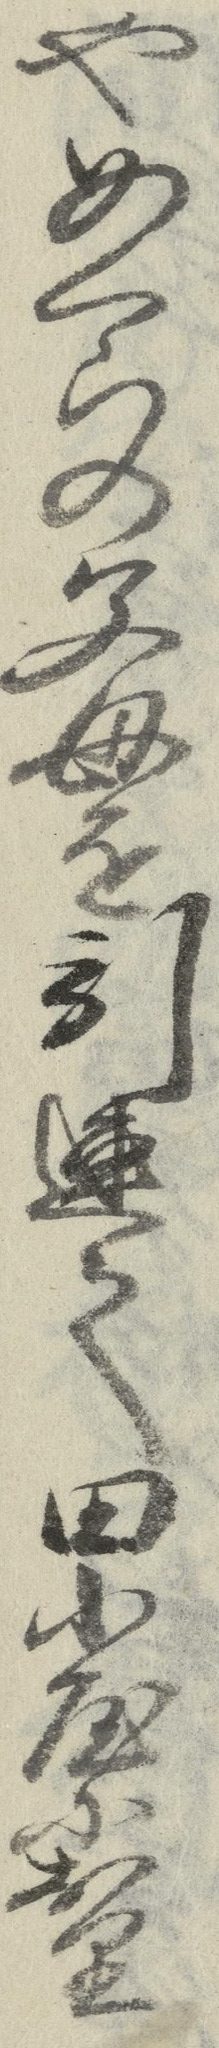やめくらの父母を引連て田小屋におり
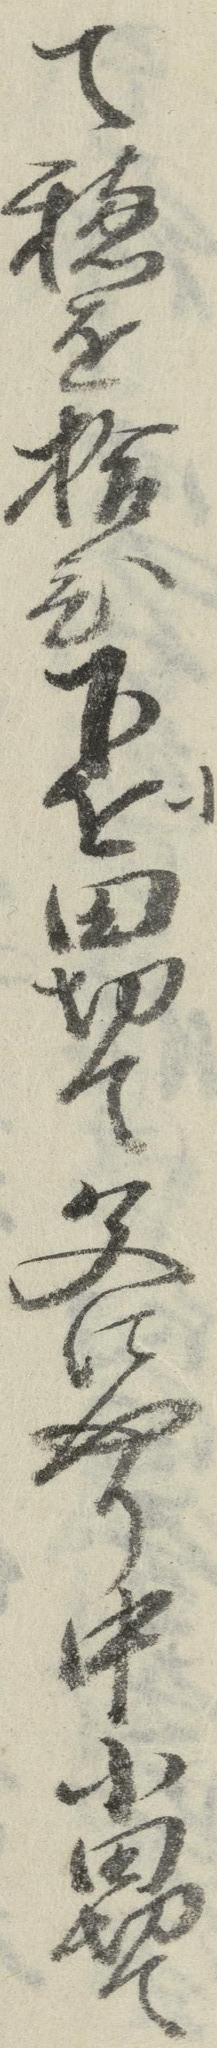て穂を拾ひ下を田切て父にやり中小田切て
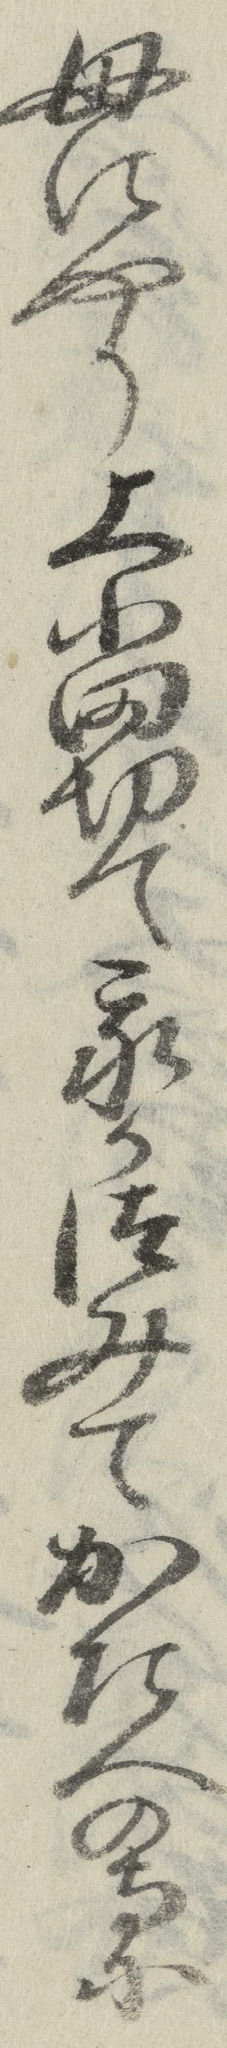母にやり上小田切て我かつみてかたへの寺に
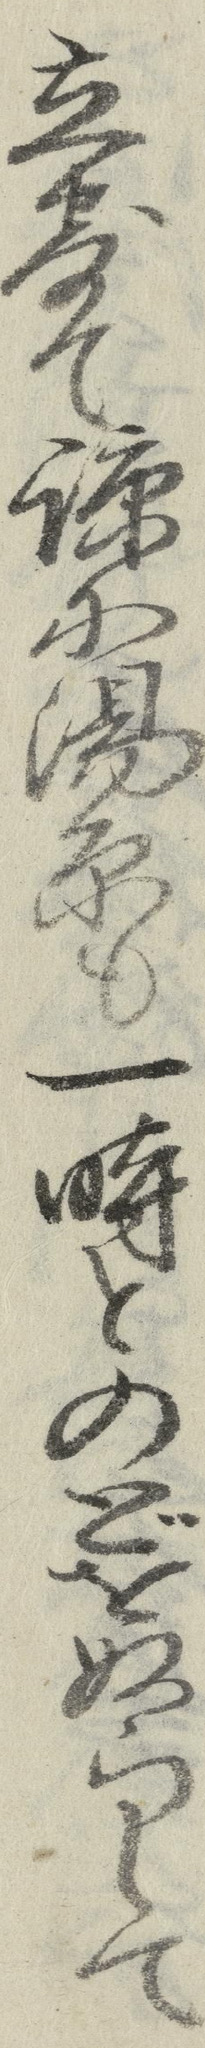立寄て諒に湯原も一時とのどをぬらして
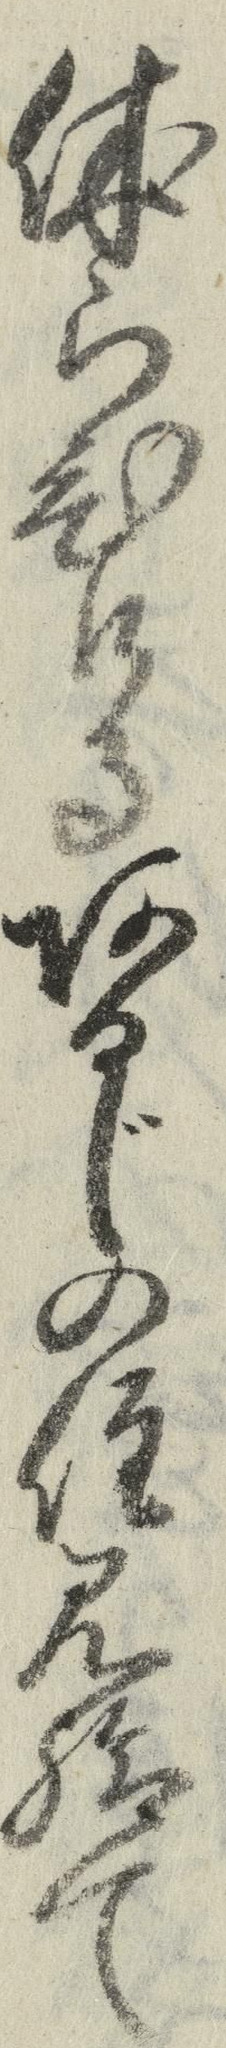体らひけるあるじの住見給て
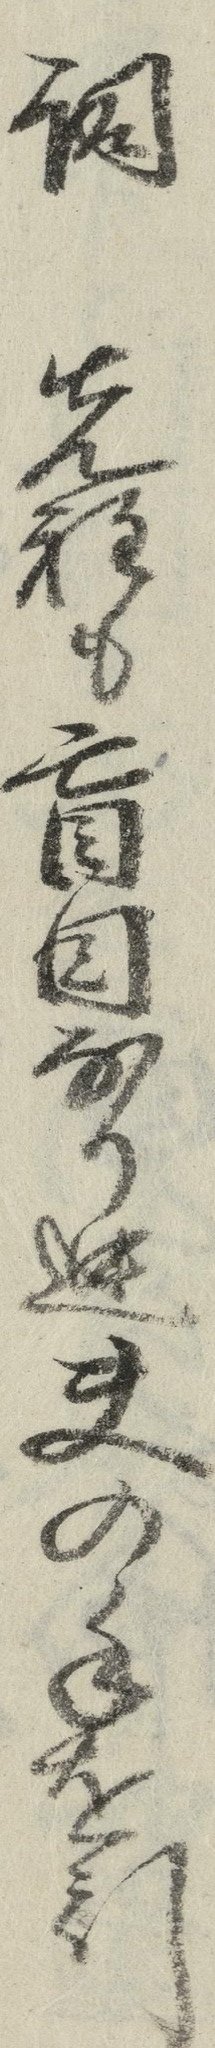詞先程も盲目なり迚夫の手を引
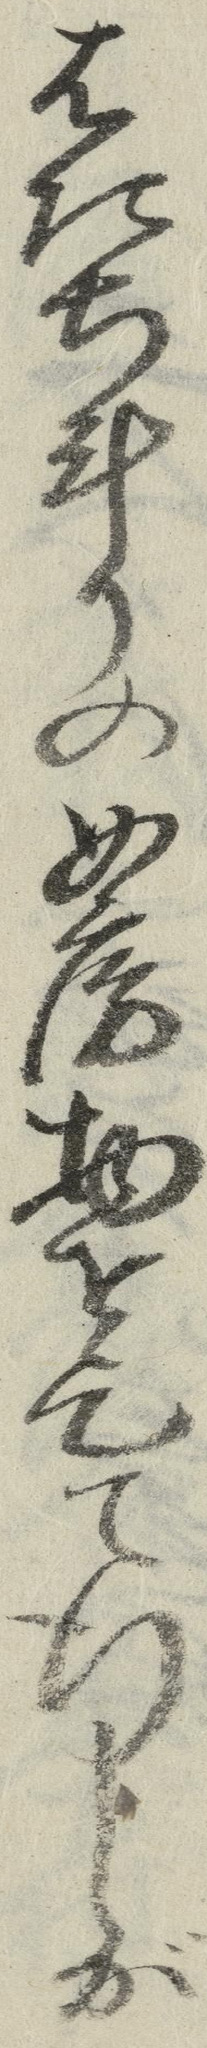はたち計りの女房物を乞て行しが
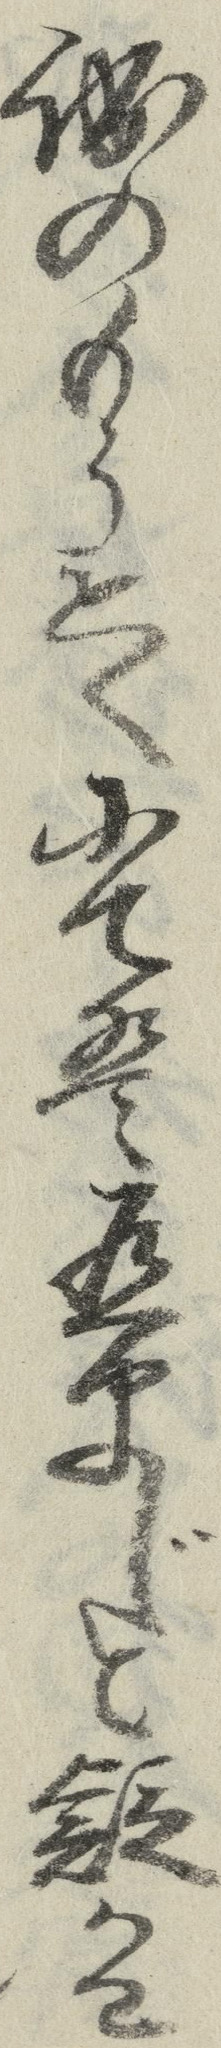誠のもうもくにては有まじと疑かわ
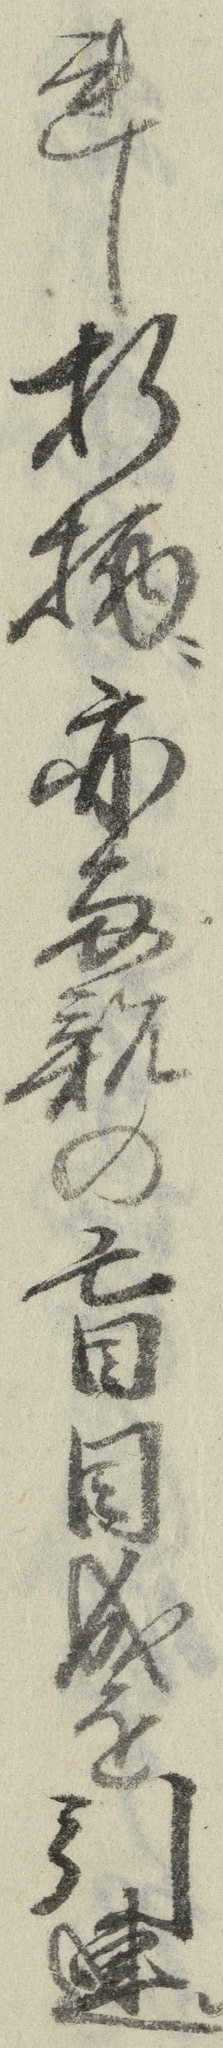れし折柄に亦両親の盲目成を引連

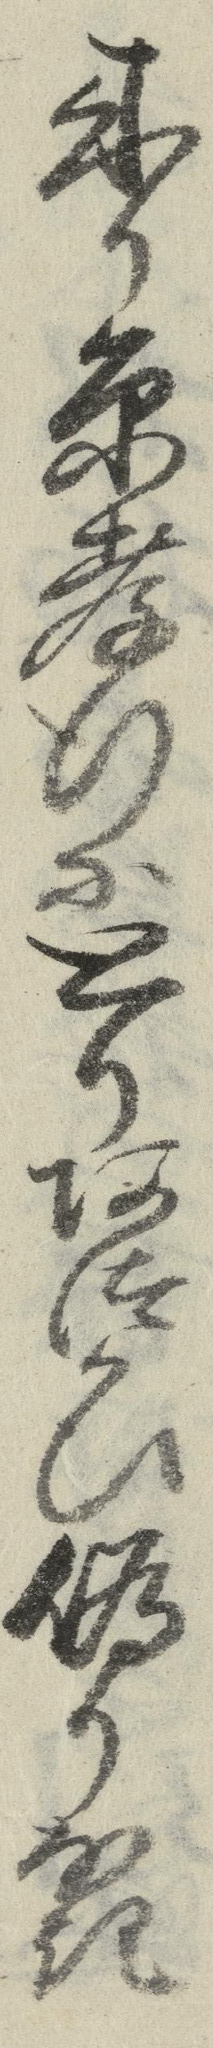来り糸孝行にとりあつかひ偽りなき
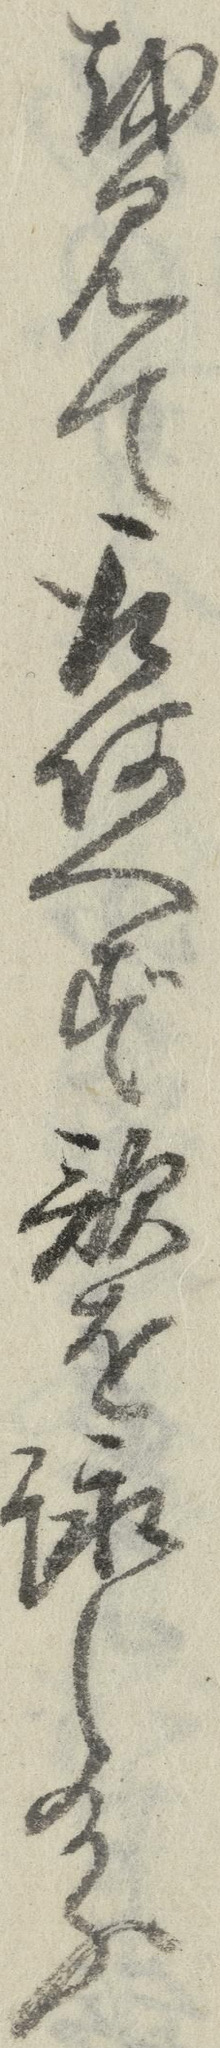を見て取あへず歌を詠し給ふ
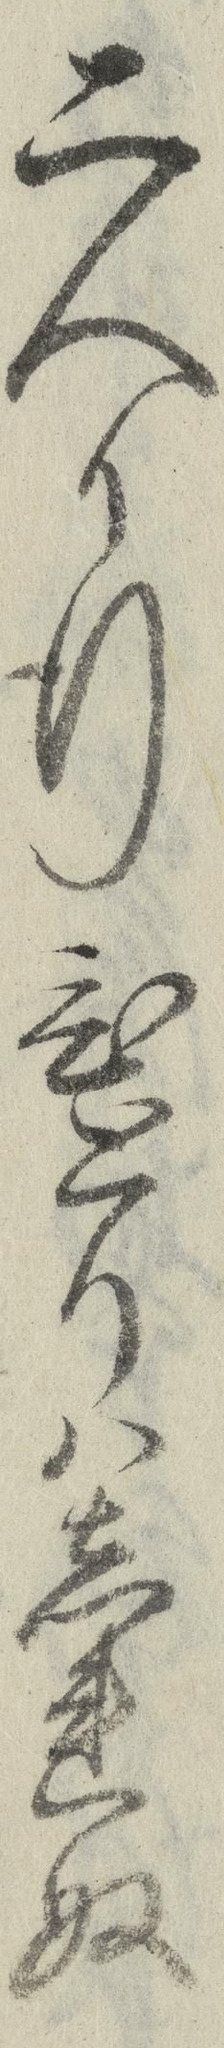二人り行ひとりはしれぬ
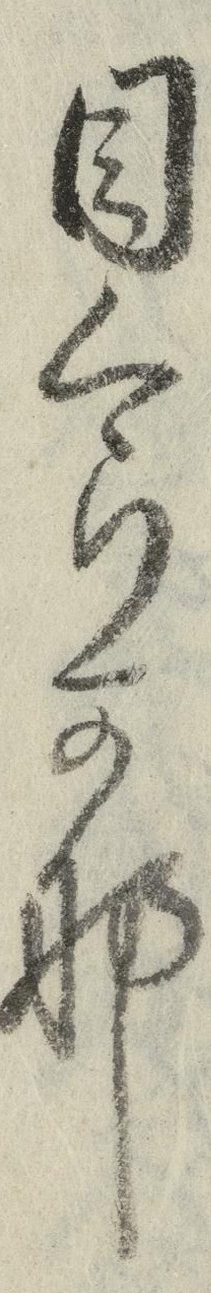目くらかな
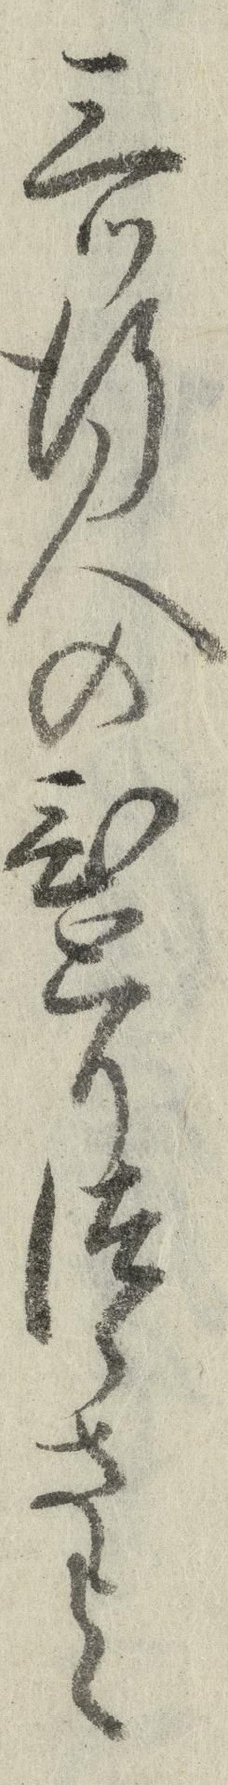三ツ行人のひとりつらさよ
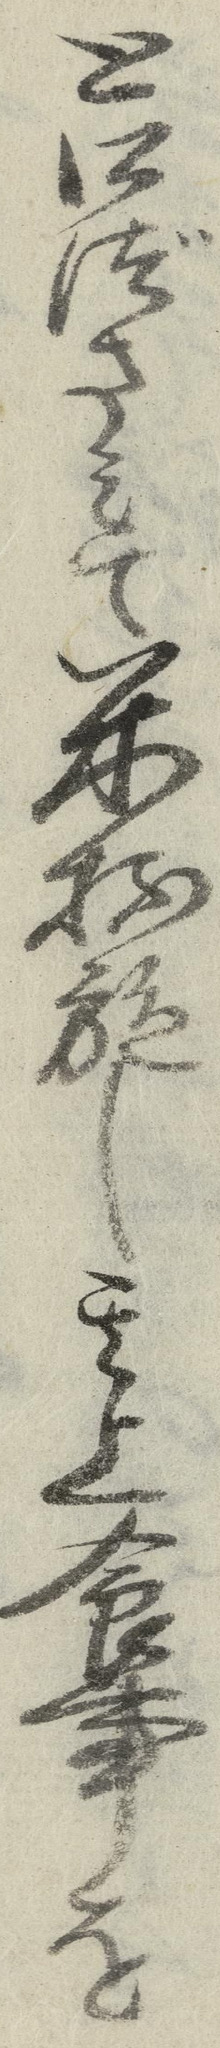と口づさみて米抔施し其上食事を
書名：浅間大焼騒動記　中
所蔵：東京大学地震研究所図書室 Earthquake Research Institute Library, The University of Tokyo, JAPAN
